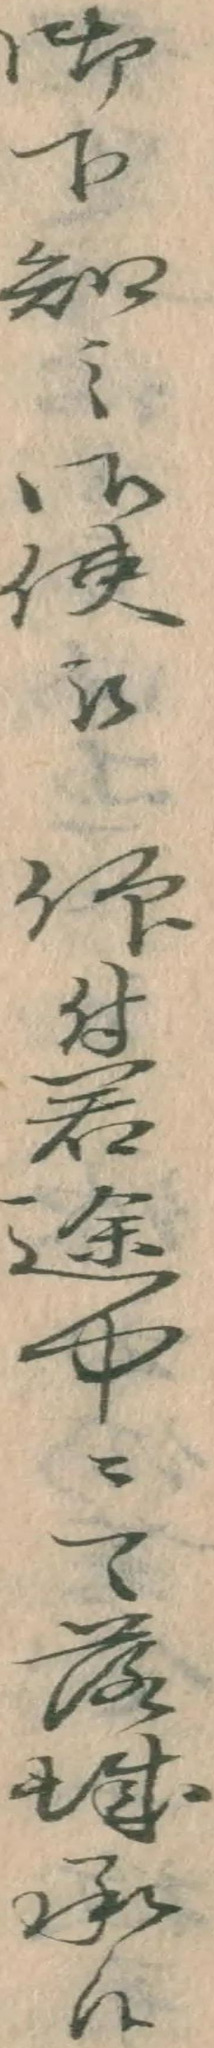御下知之御使被仰付若途中にて落城承候
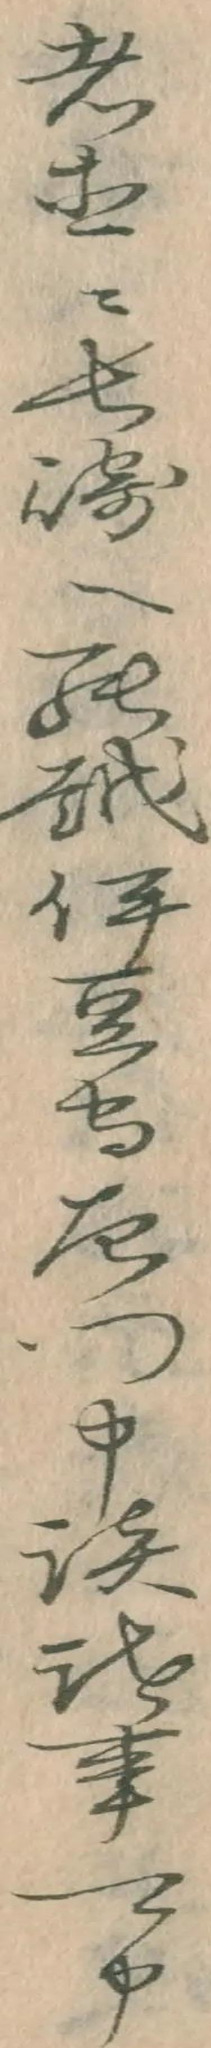者直に長崎へ罷越伊豆守左門申談諸事可申
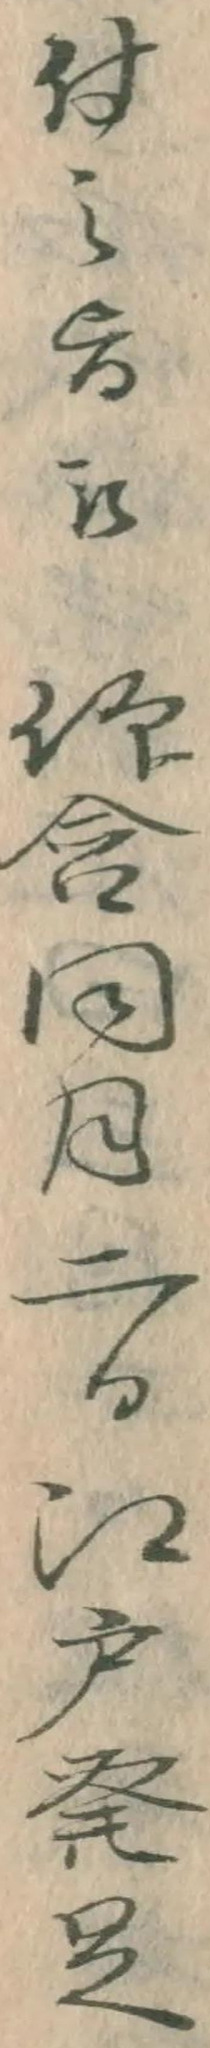付之旨被仰合同月二日江戸発足

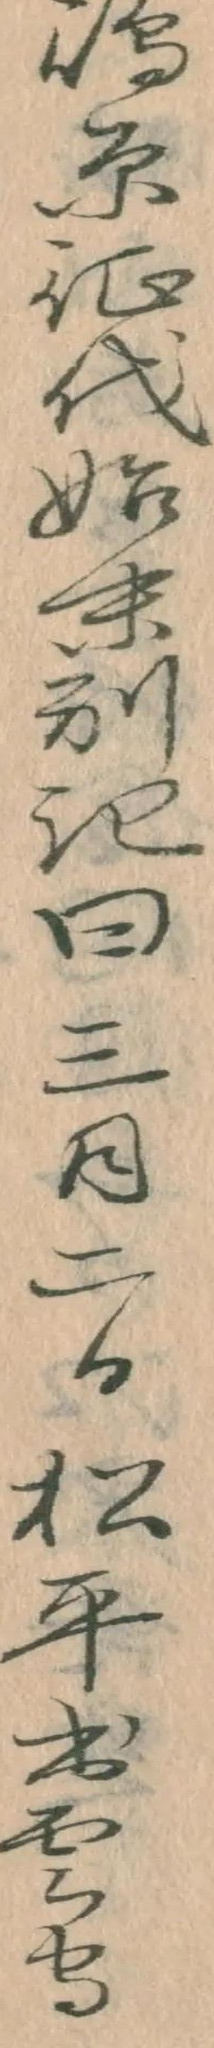島原征伐始末別記曰三月二日松平出雲守
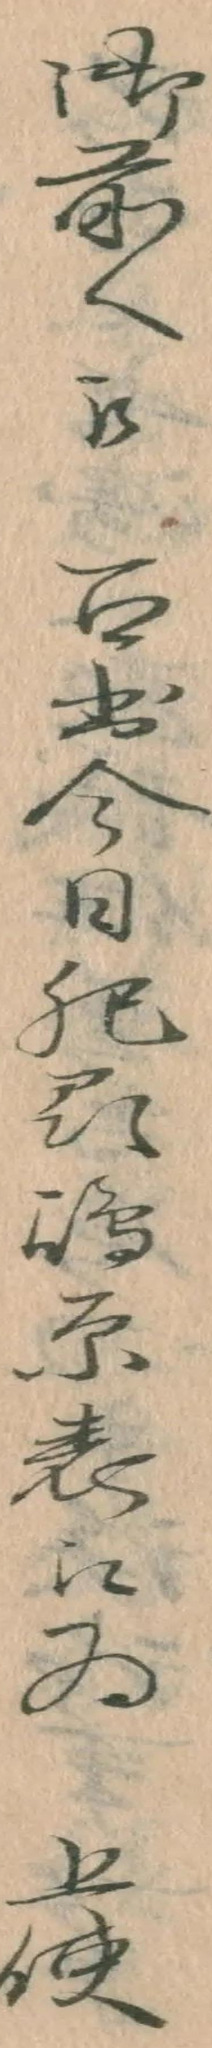御前へ被召出今日肥州島原表江ゐ上使
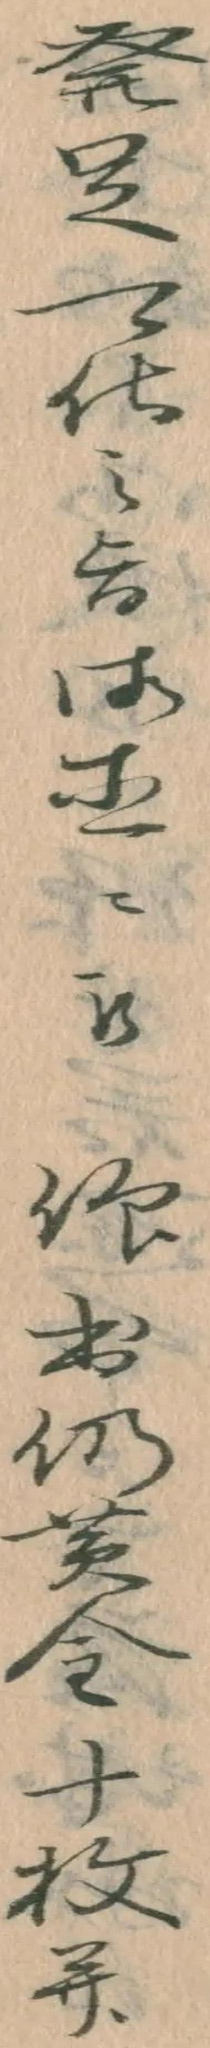発足可仕之旨御直に被仰出仍黄金十枚幷
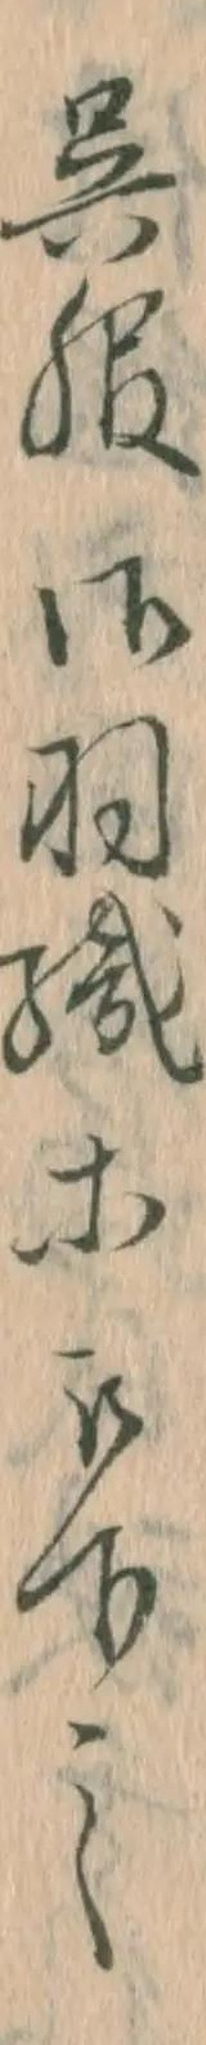呉服御羽織等被下之
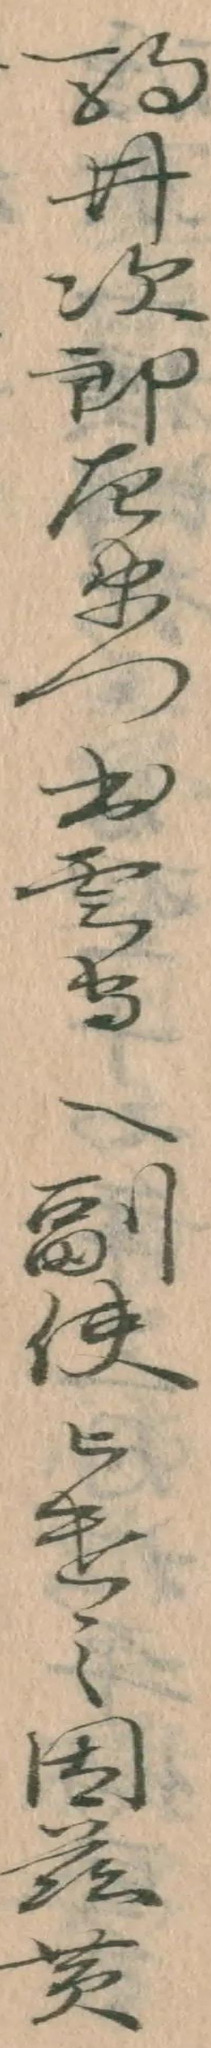駒井次郎左衛門出雲守へ副使被遣之固茲黄
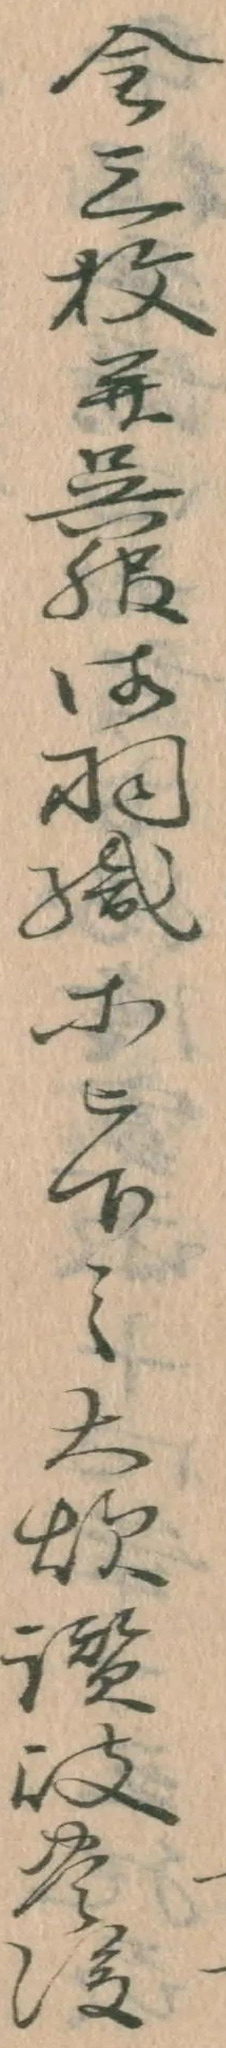金三枚幷呉服御羽織等被下之大炊讃岐豊後
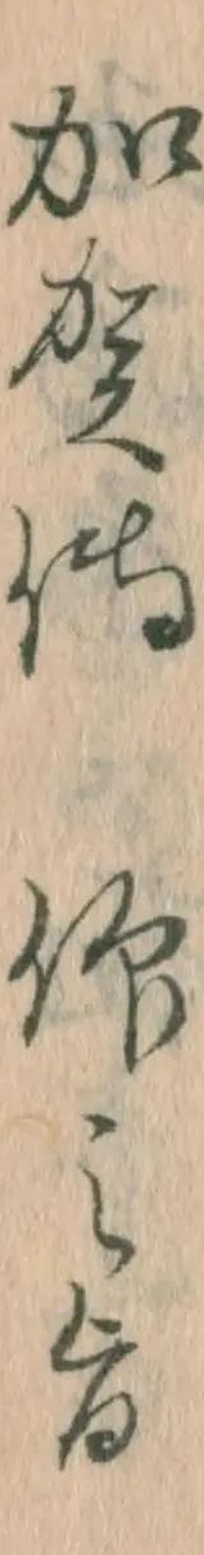加賀伝仰之旨
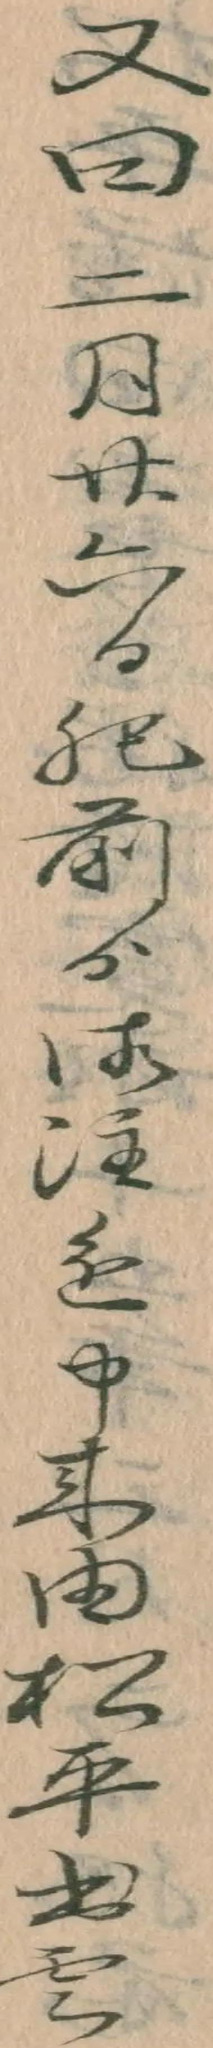又曰二月廿六日肥前ゟ御注進申来由松平出雲
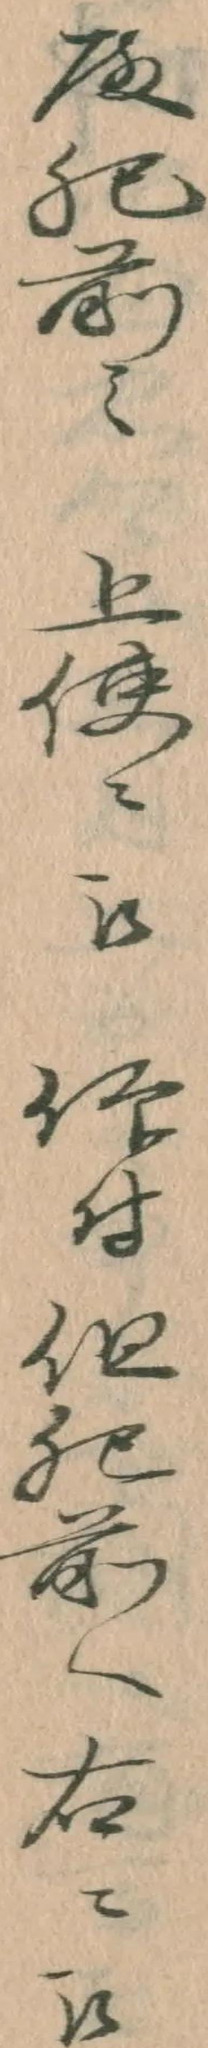殿肥前之上使に被仰付但肥前へ右に被
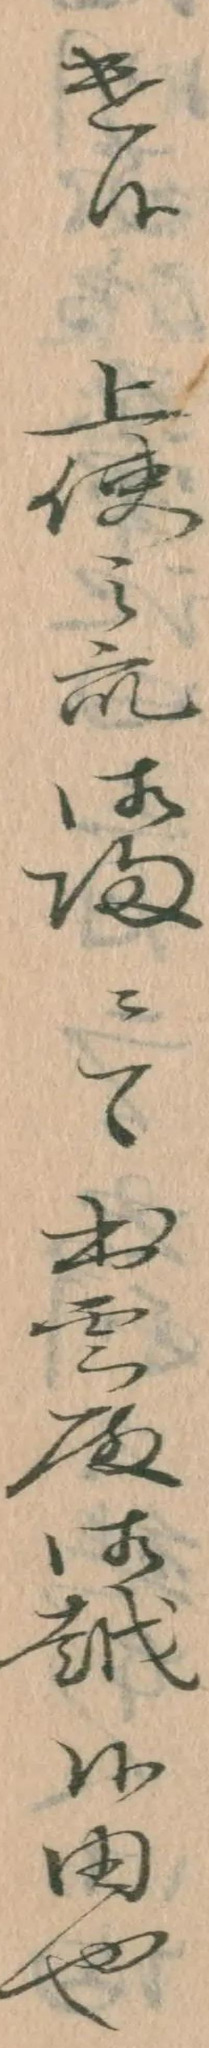遣候上使之衆御帰にて出雲殿御越候由也
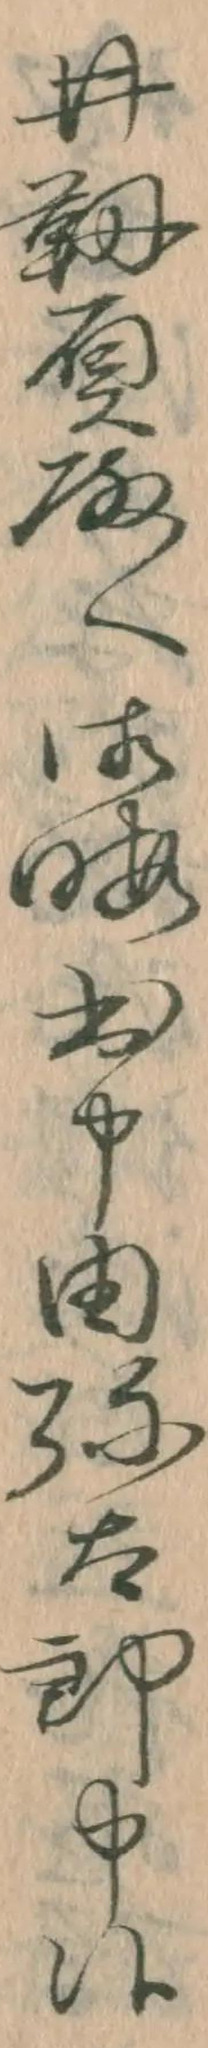井靭負殿へ御暇出申由弥太郎申候
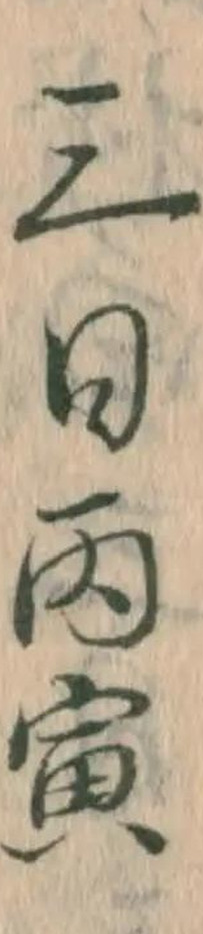三日丙寅
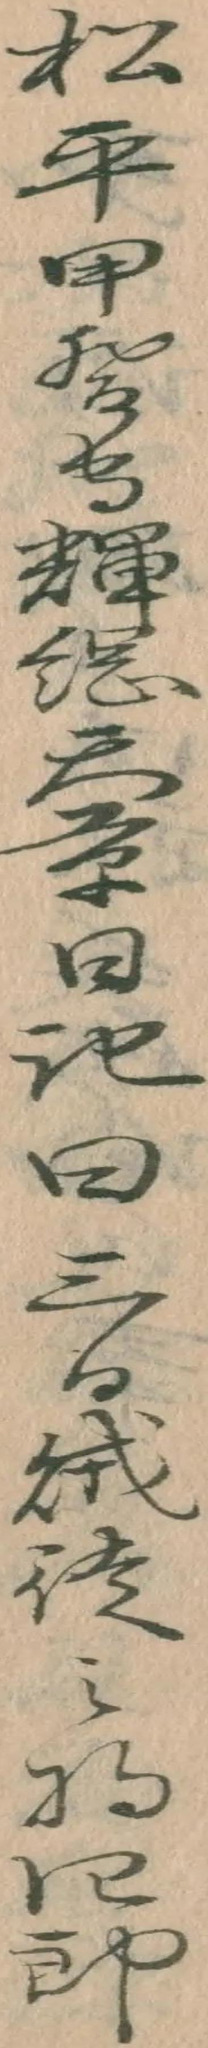松平甲斐守輝綱天草日記曰三日賊徒之将四郎
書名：切支丹御退治記 49巻. [9]
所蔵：国立国会図書館 National Diet Library, JAPAN
